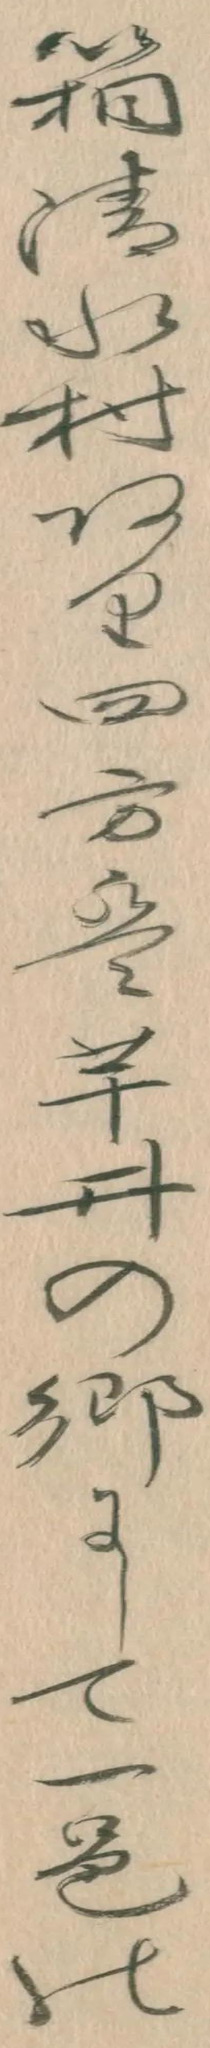箱清水村あり四方は芋井の郷にして一邑の
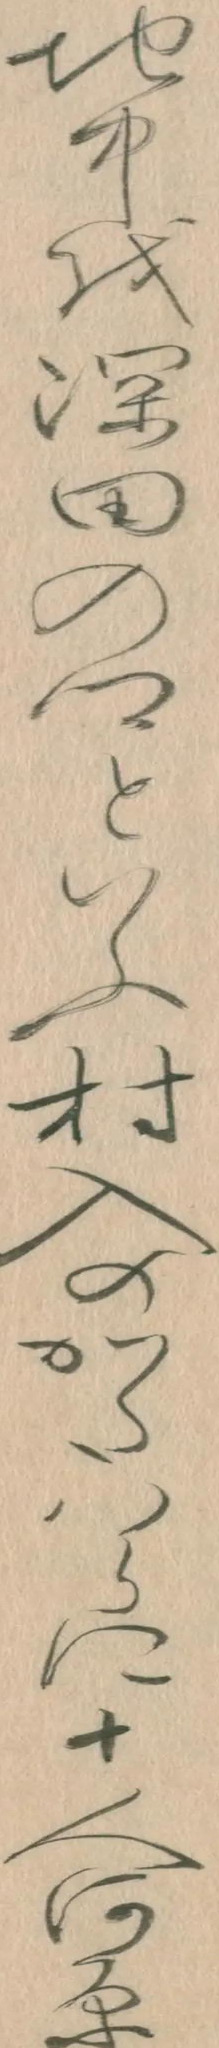地中を深田の郷といふ村入のかたはらに十人河原
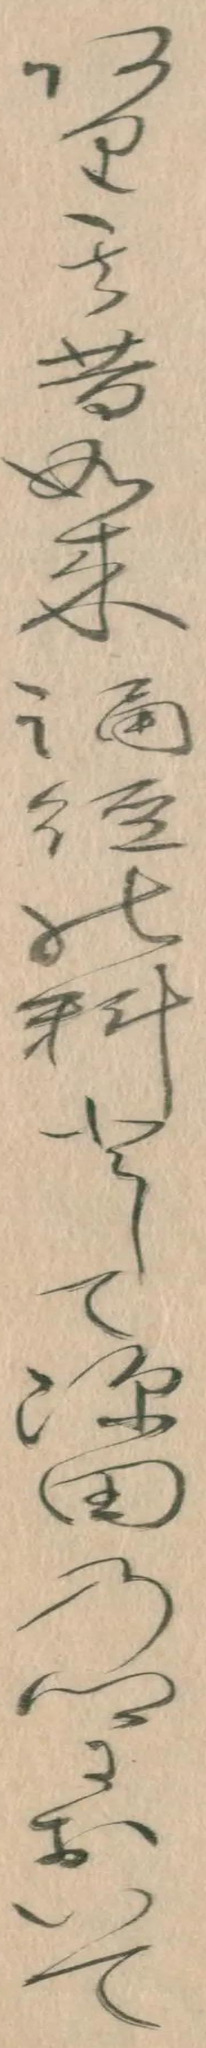あり其昔如来誦経の料として深田の郷において
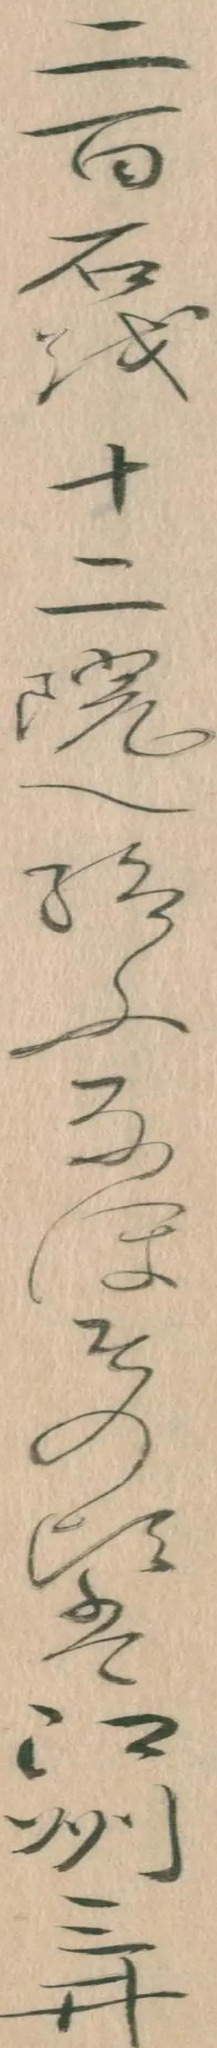二百石を十二院へ給ふなほその頃は江拾三井
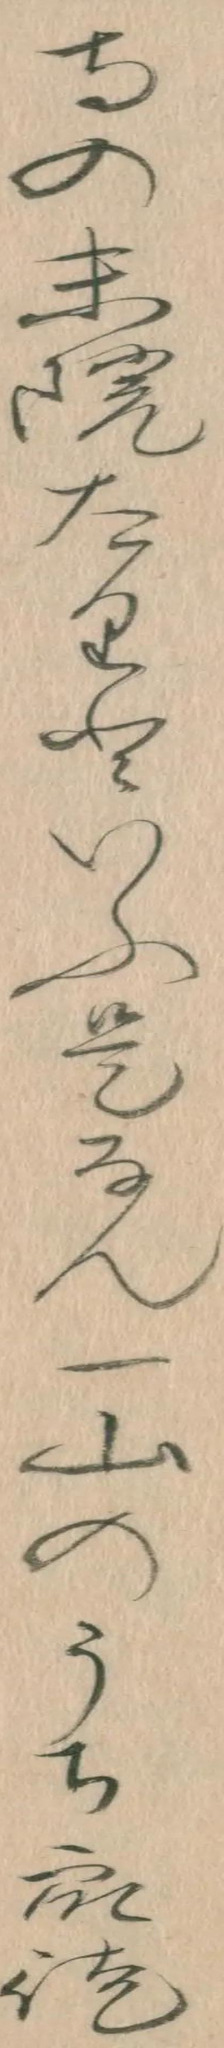寺の末院たりといふ是なん一山のうち衆徒
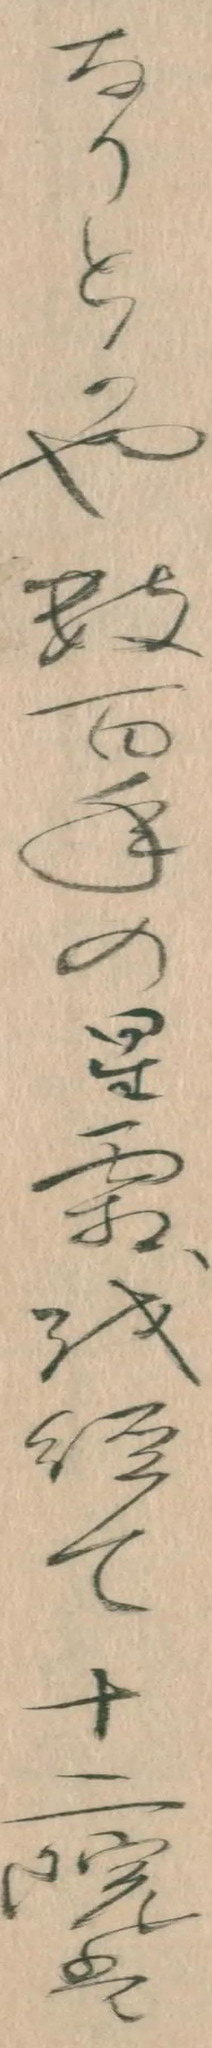なりとかや数百年の星霜を経て十二院は
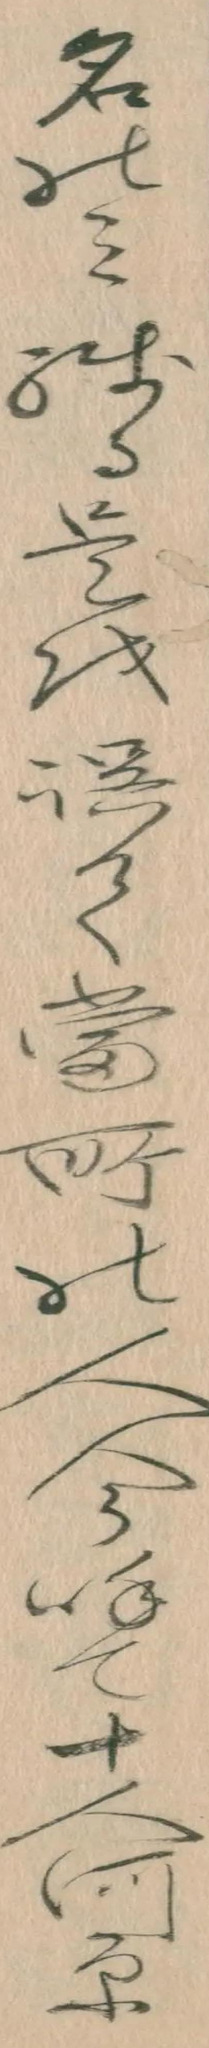名のみ残る是を誤て当所の人今呼て十人河原
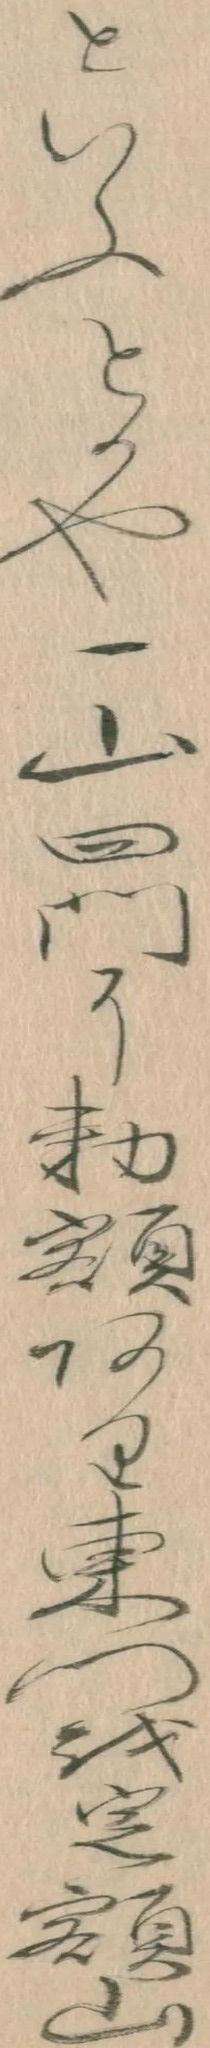といふとかや一山四門に勅額あり東門を定額山
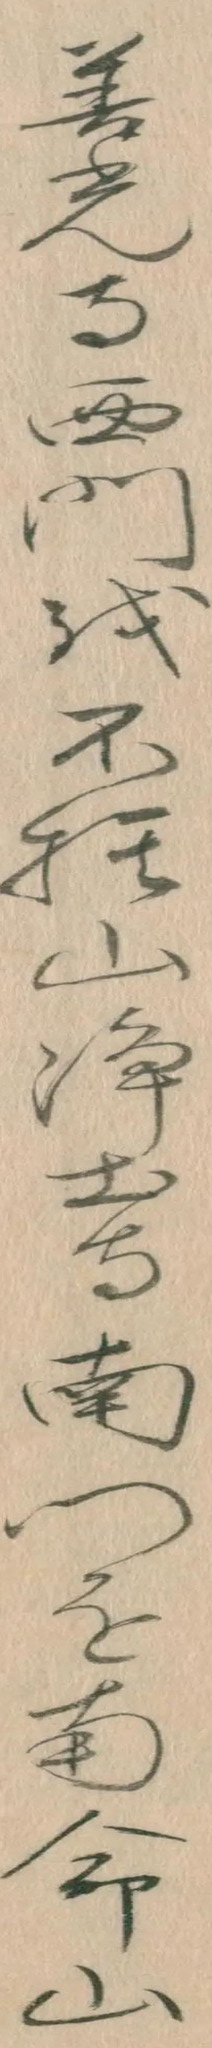善光寺西門を不捨山浄土寺南門を南命山
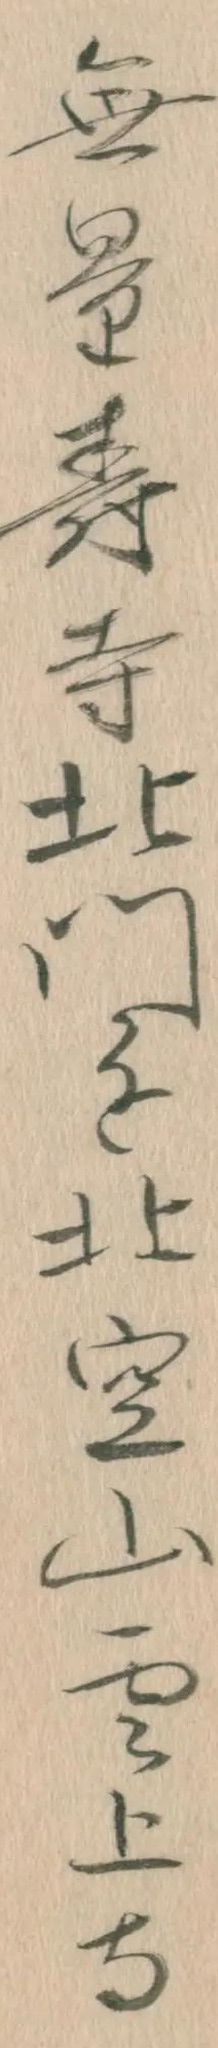無量寿寺北門を北空山雲上寺
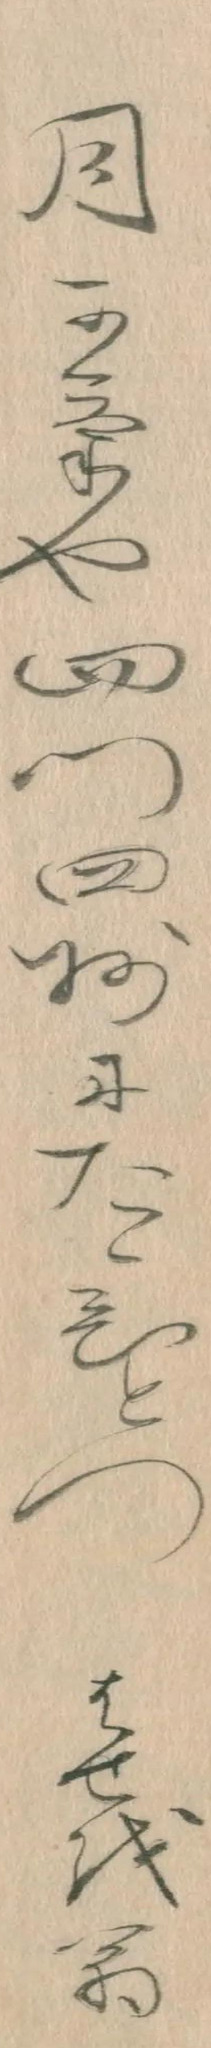月かけや四門四州にたゝひとつはせを翁
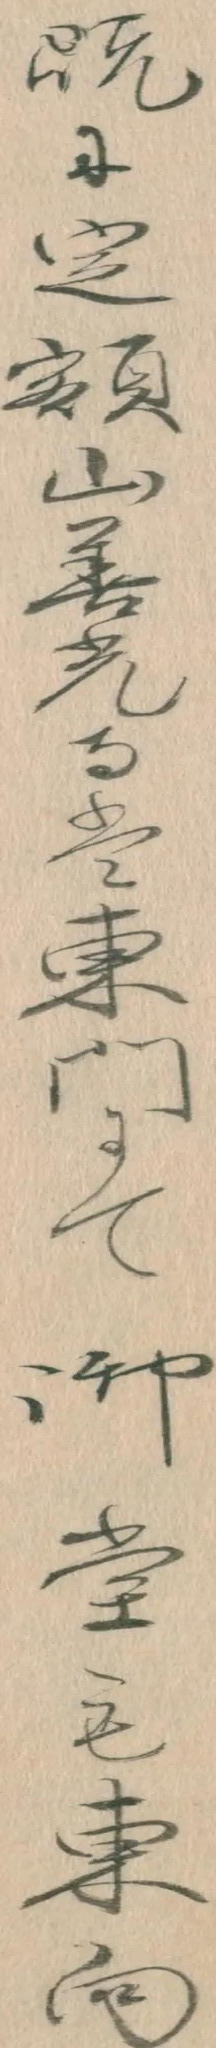既に定額山善光寺は東門にて御堂も東向
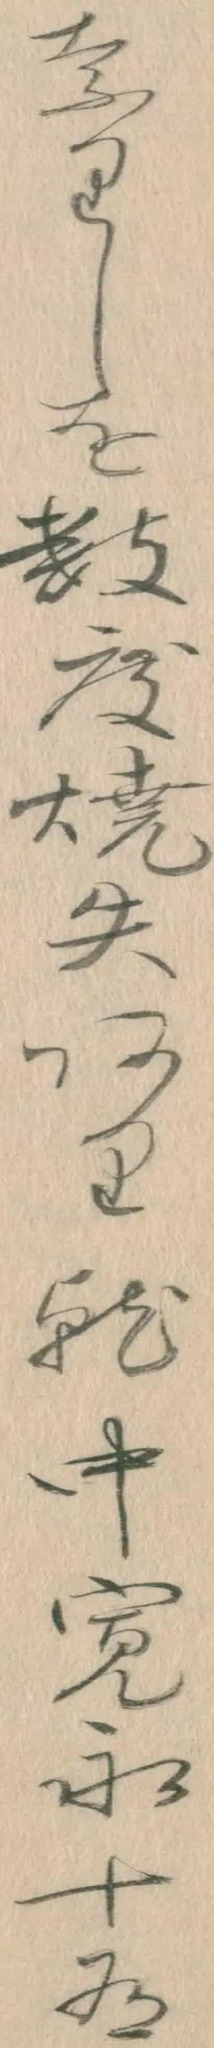なりしを数度焼失あり就中寛永十有
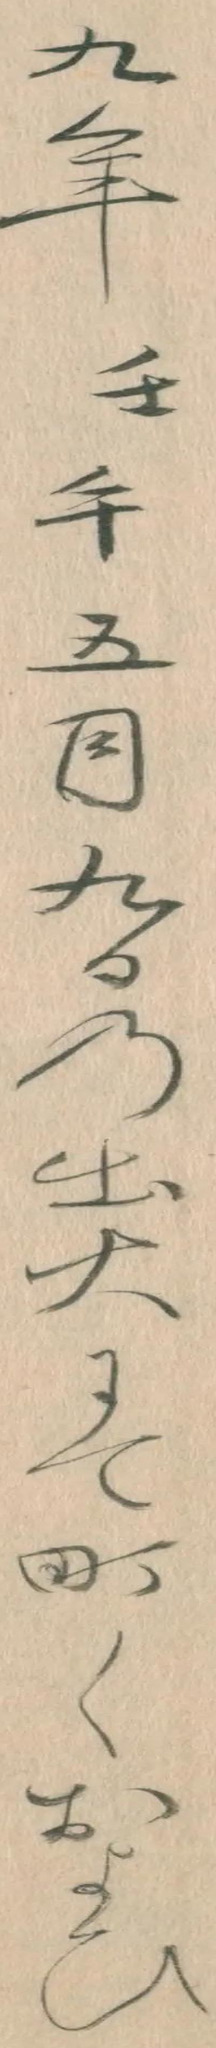九年壬午五月九日の出火にて町〳〵およひ
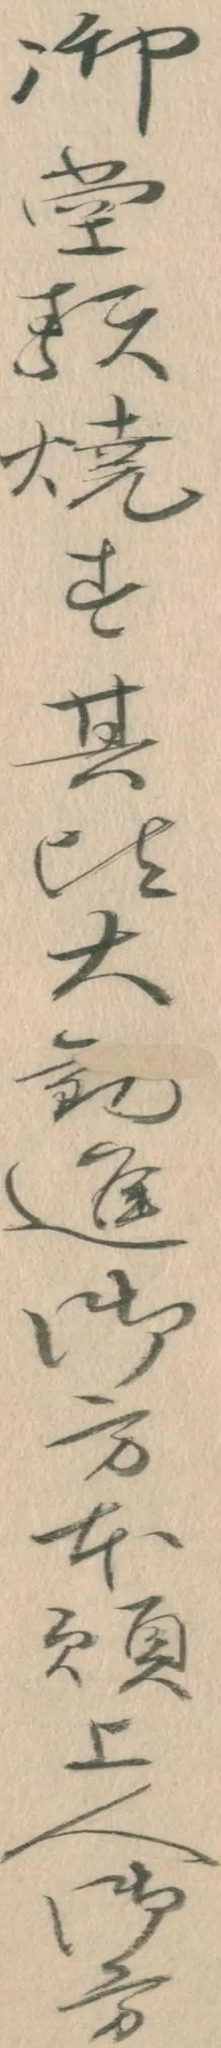御堂類焼す其頃大勧進御方本領上人御方
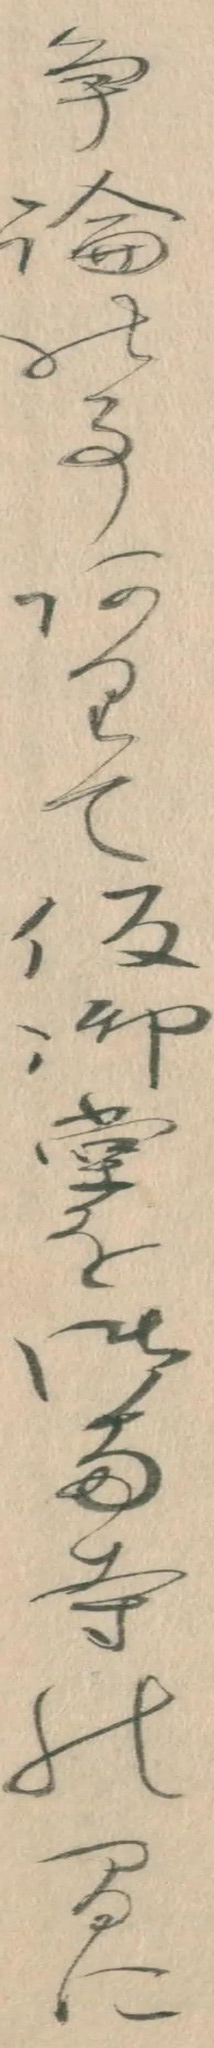争論の事ありて仮御堂を御両寺の間に
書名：俗語之種. [1]
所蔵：国立国会図書館 National Diet Library, JAPAN
